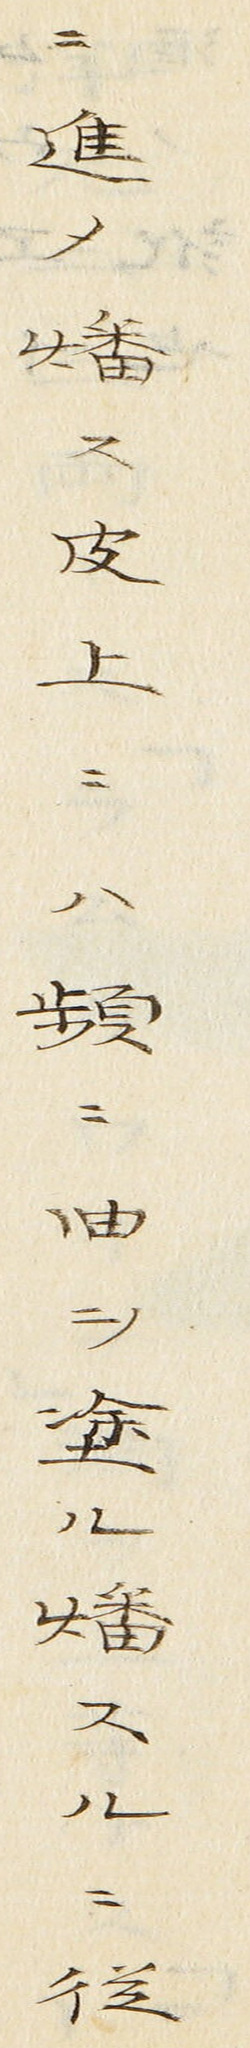ニ進シテ燔ス皮上ニハ頻ニ油ヲ塗ル燔スルニ従
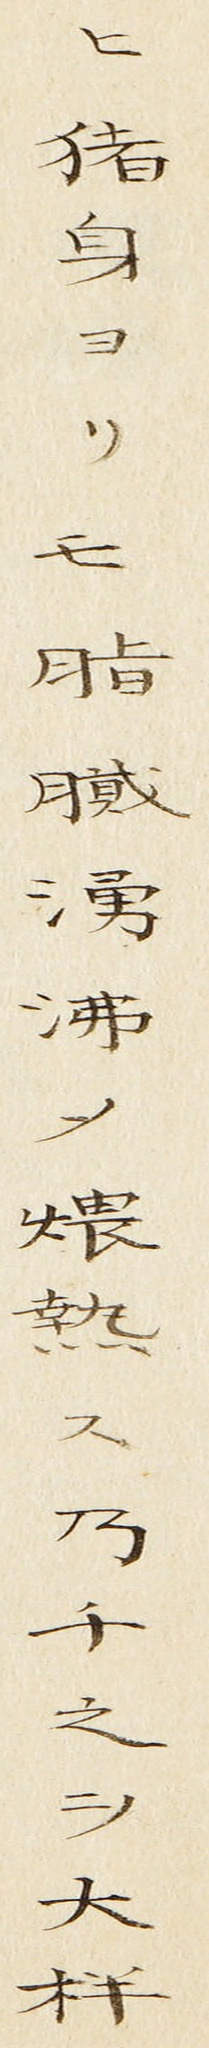ヒ猪身ヨリモ脂膩？湧沸シテ煨熱ス乃チ之ヲ大柈
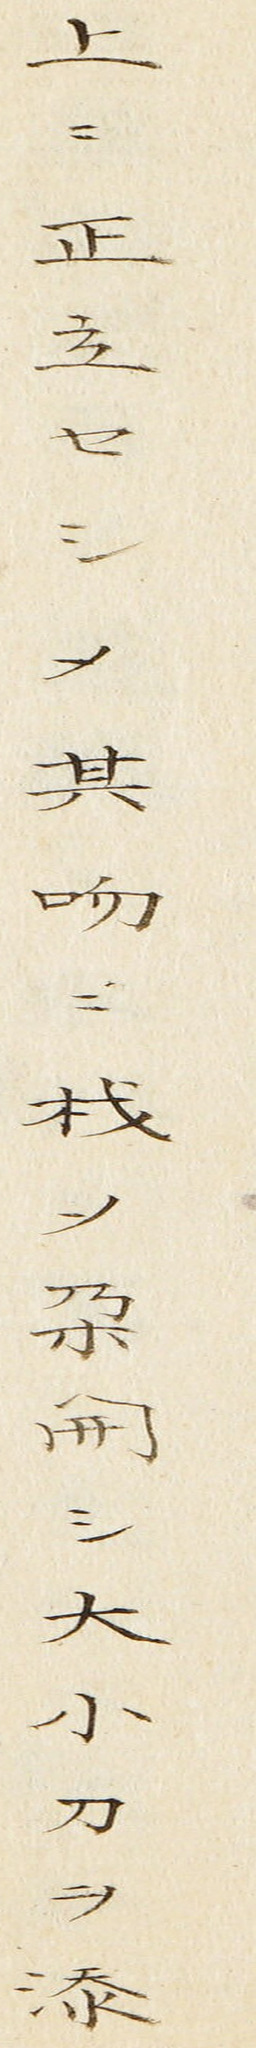上ニ正立セシメ其吻ニ杙？シテ朶開シ大小刀ヲ添
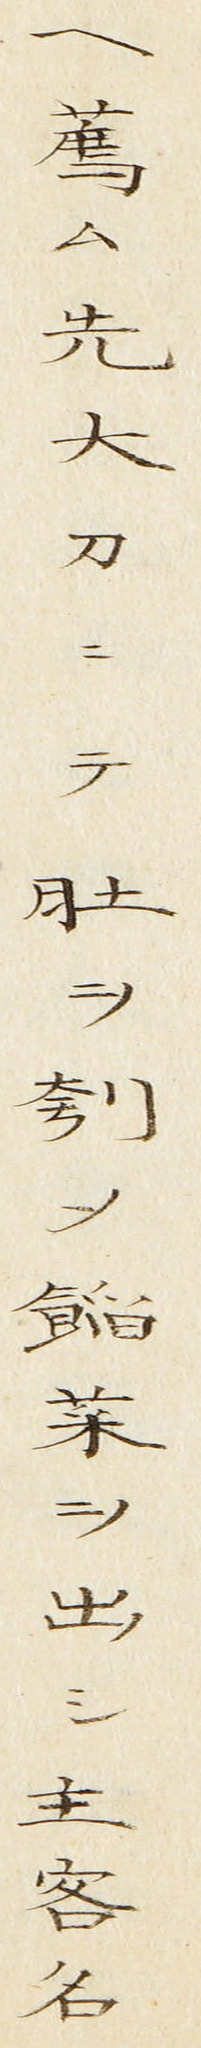ヘ薦ム先大刀ニテ肚ヲ刳シテ饀菜ヲ出シ主客名
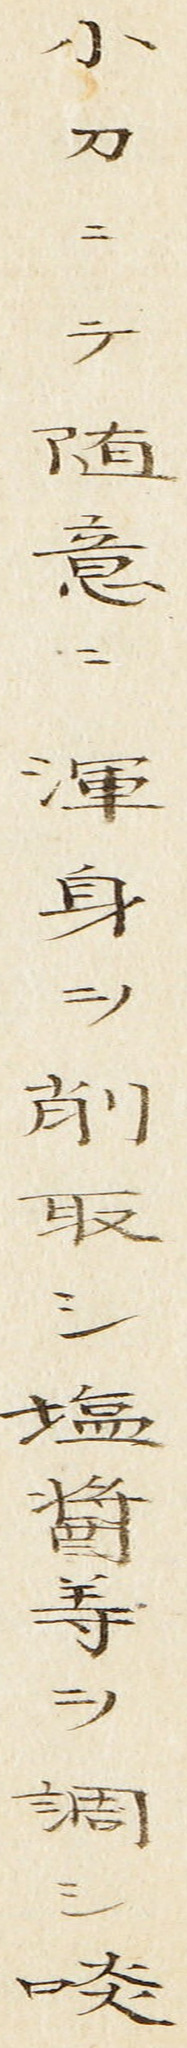小刀ニテ随意ニ渾身ヲ削取シ塩醤等ヲ調シ啖
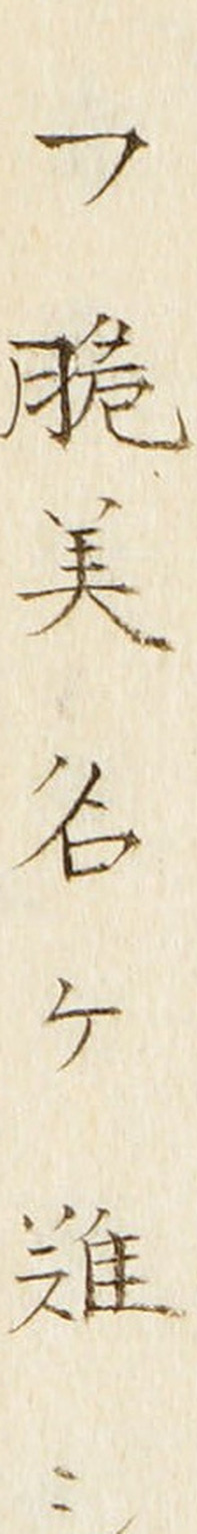フ脆美名ケ難シ
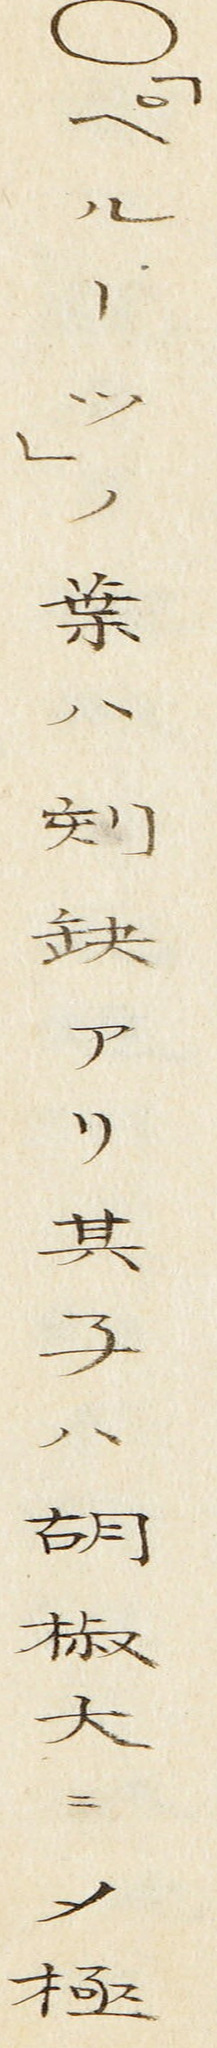〇「ペルーツ」ノ葉ハ刻？缺アリ其子ハ胡椒大ニシテ極
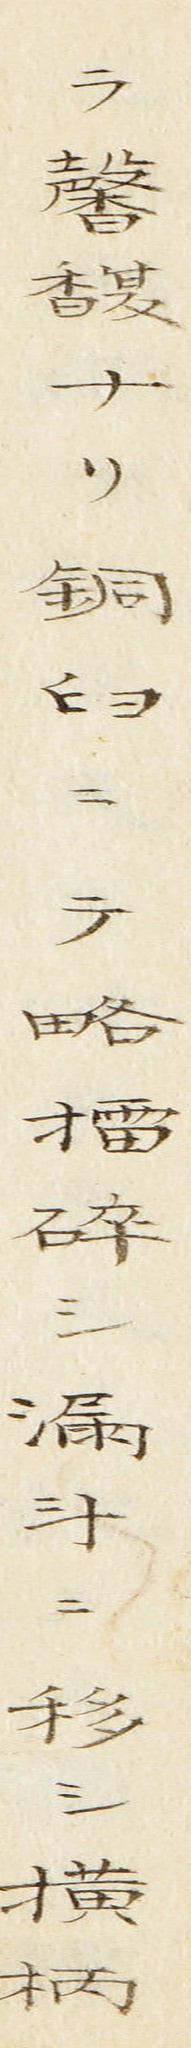テ香馥ナリ銅臼ニテ略擂碎シ漏斗ニ移シ横柄

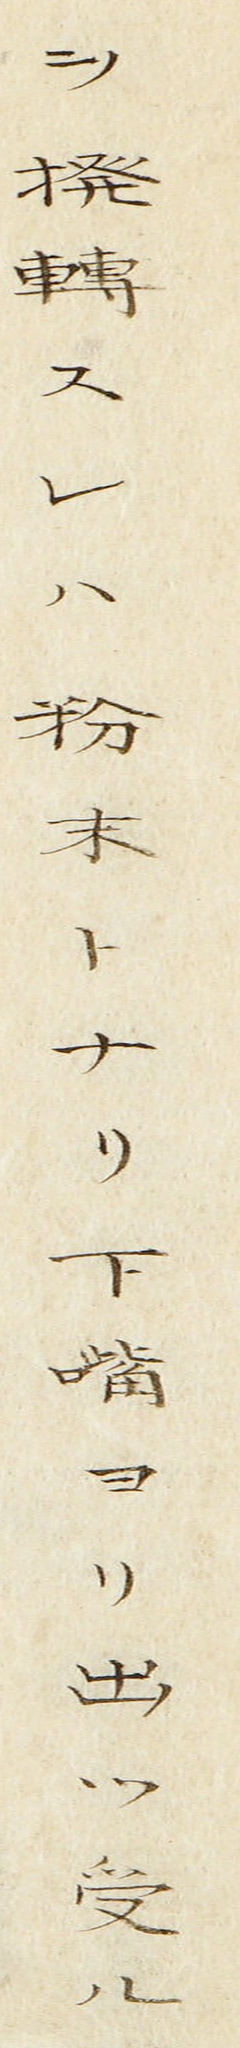ヲ撥転スレハ粉末トナリ下嘴ヨリ出ツ受ルニ
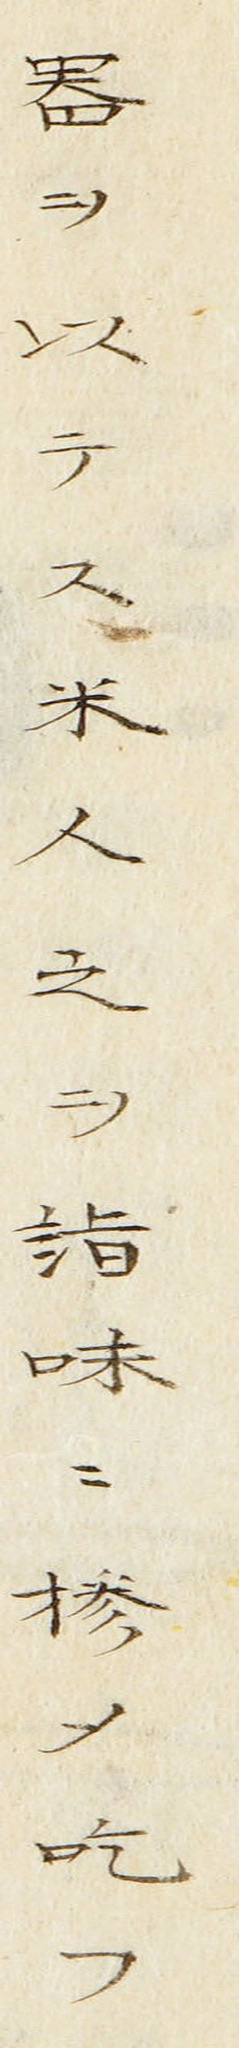器ヲ以テス米人之ヲ詣味ニ摻シテ吃フ
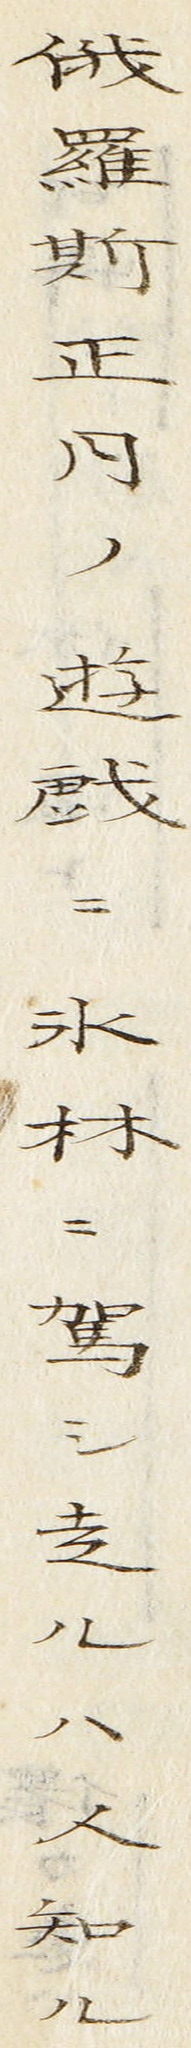俄羅斯正月ノ遊戯ニ氷林ニ駕シ走ルハ人知ル
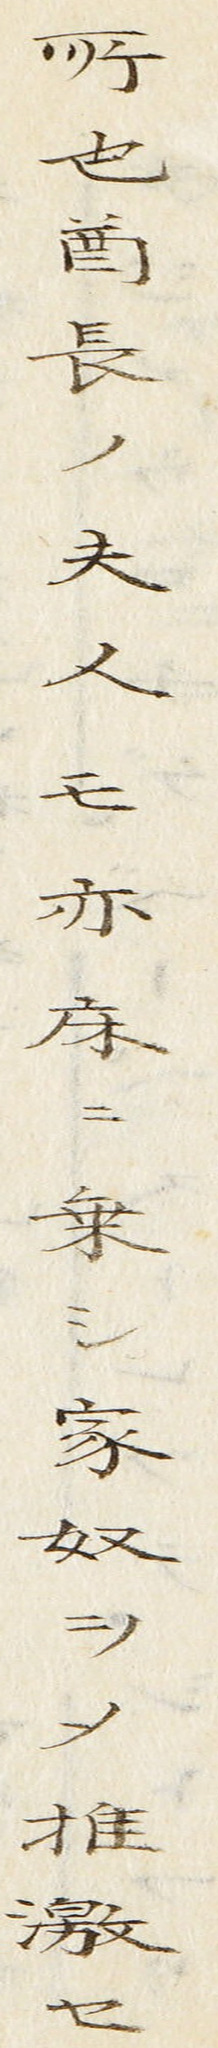所也酋長ノ夫人モ亦床ニ乗シ家奴ヲシテ推激セ
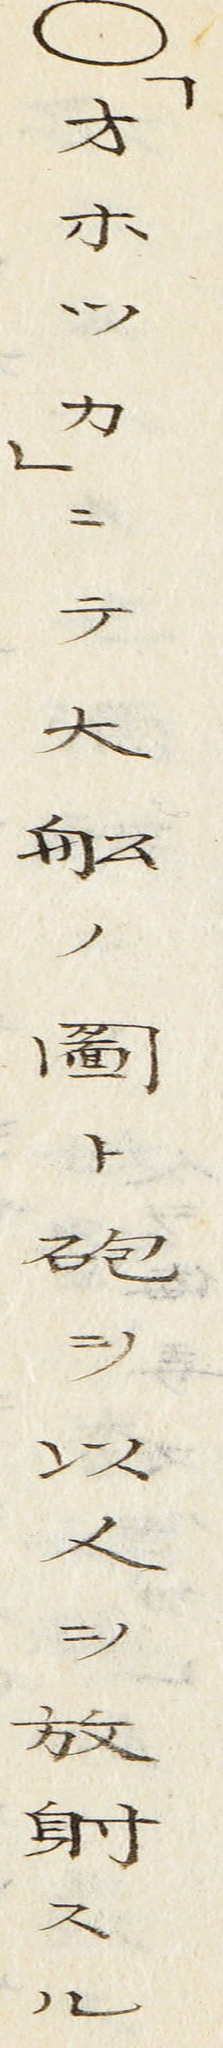〇「オホツカ」ニテ大船ノ図ト砲ヲ以人ヲ放射スル
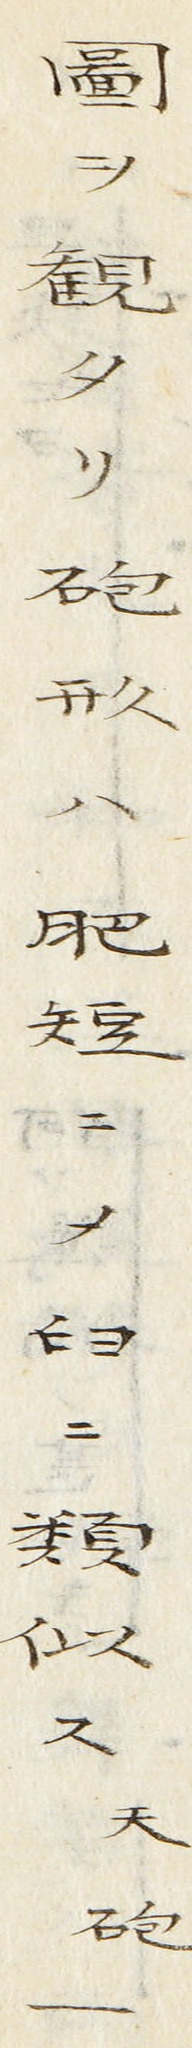図ヲ観タリ砲形ハ肥短ニシテ臼ニ類似ス天砲一
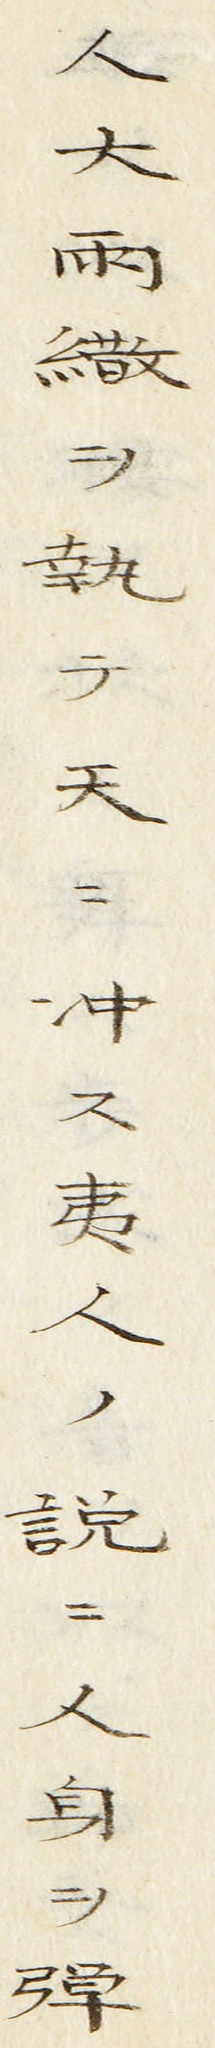人大雨繖ヲ執テ天ニ冲ス夷人ノ説ニ人身ヲ弾
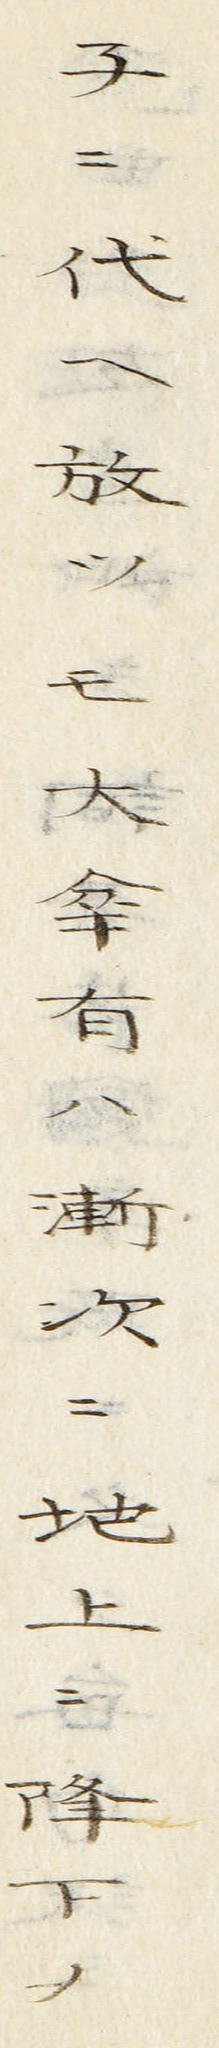子ニ代へ放ツモ大傘有ハ漸次ニ地上ニ硬化降下シテ
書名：蕃談
